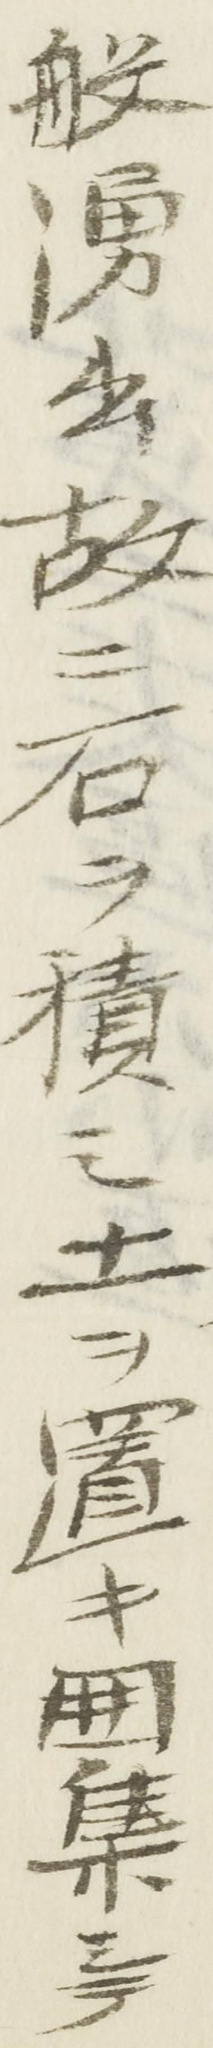般湧出故ニ石ヲ積ミ土ヲ置キ囲集シテ
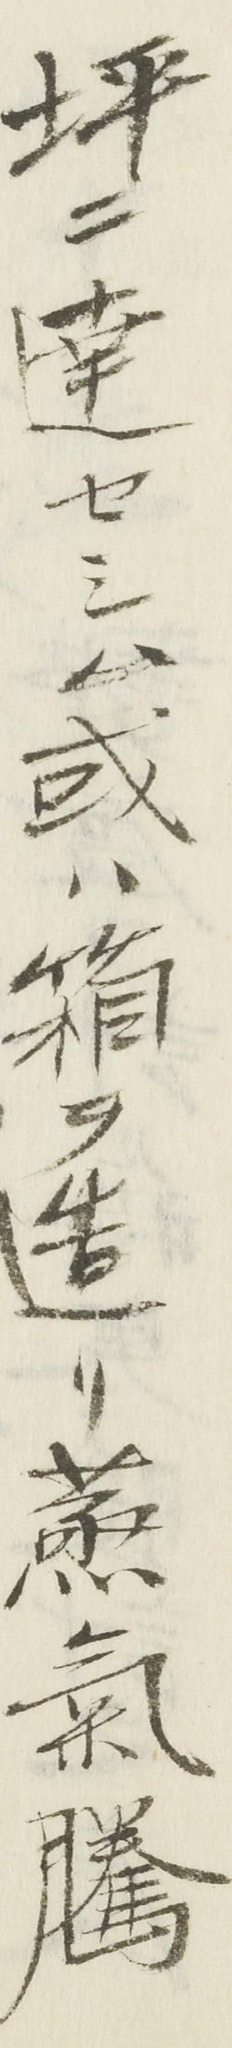坪二達セシハ或ハ箱ヲ造リ蒸気騰
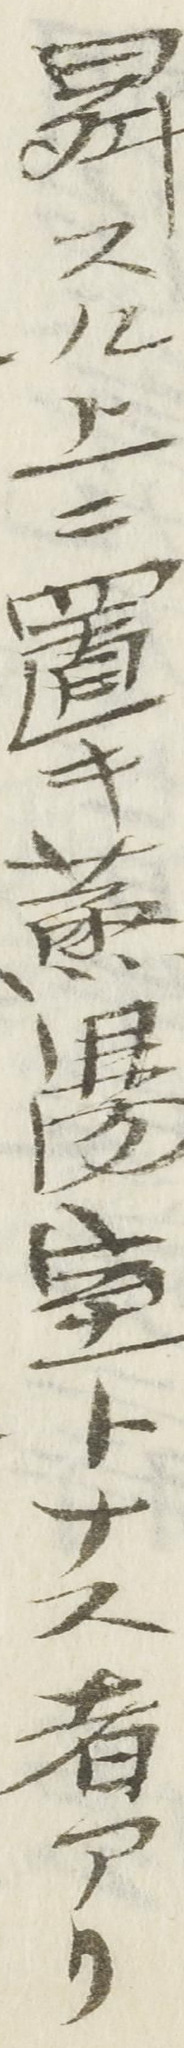昇スル上二置キ薫湯室トナス者アリ
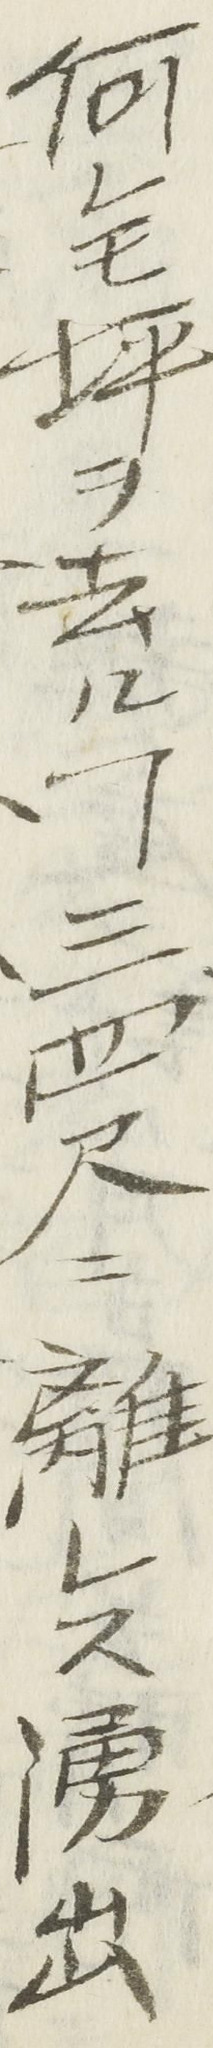何レモ坪ヲ去ルコト三四尺二離レス湧出
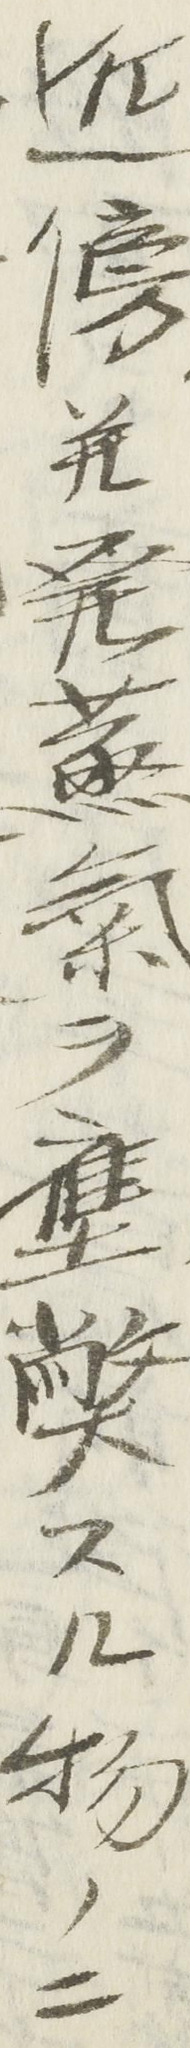近傍幷発蒸気ヲ雍獘スル物ノニ
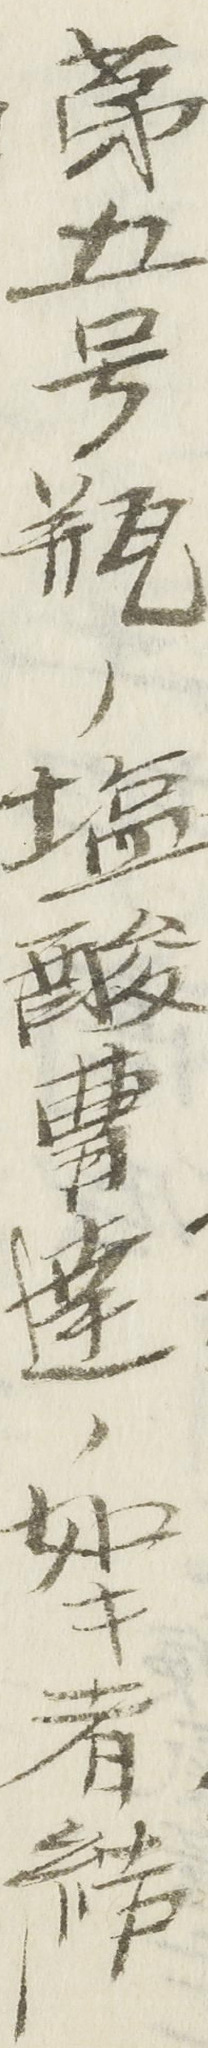第五号瓶ノ塩酸曹達ノ如キ者結
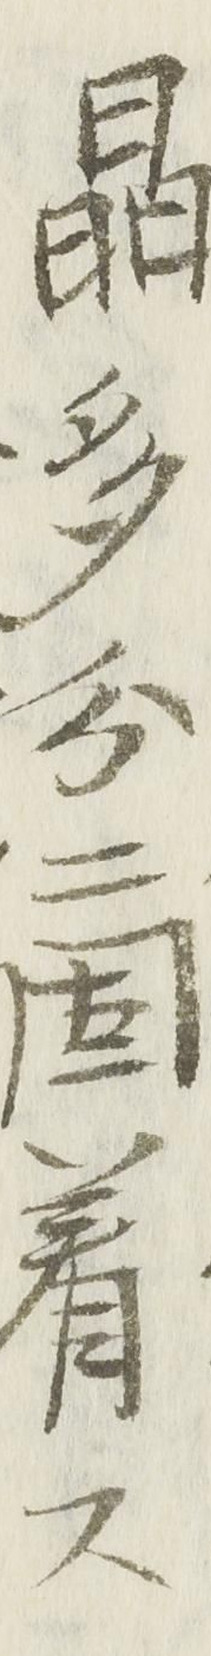晶多分二固着ス
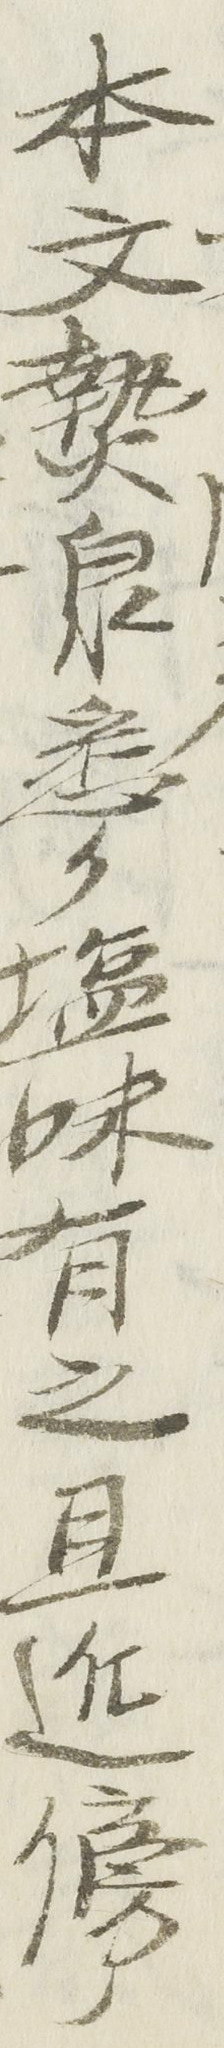本文熱泉悉ク塩味有之且近傍ノ
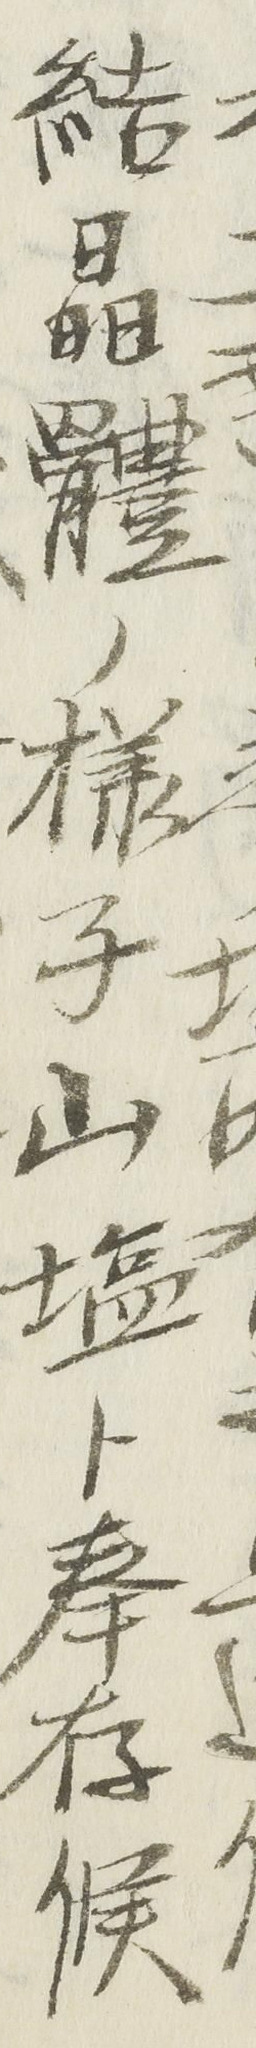結晶体ノ様子山塩ト奉存候
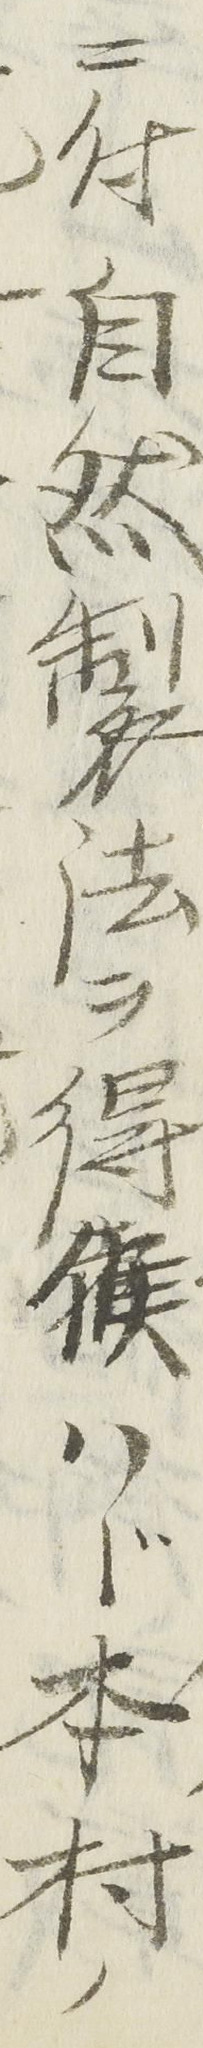二付自然製法ヲ得候ハヾ本村ノ
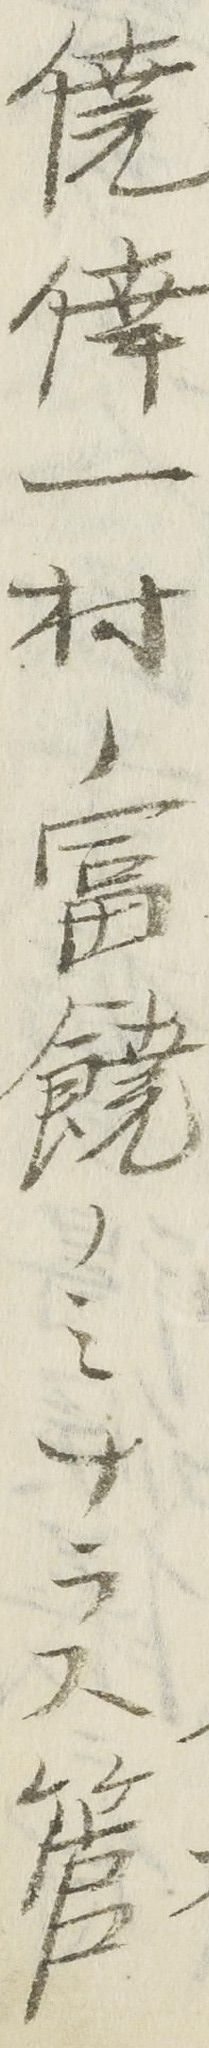僥倖一村ノ富饒ノミナラス管

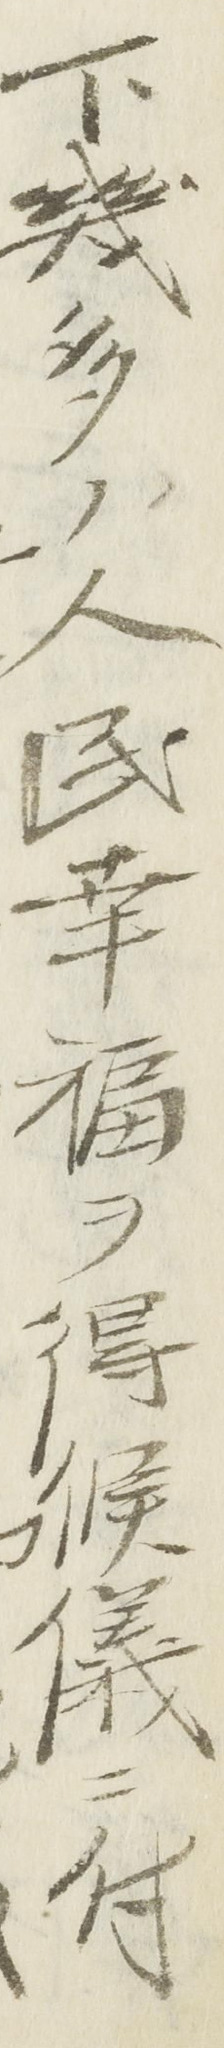下幾多ノ人民幸福ヲ得候儀二付
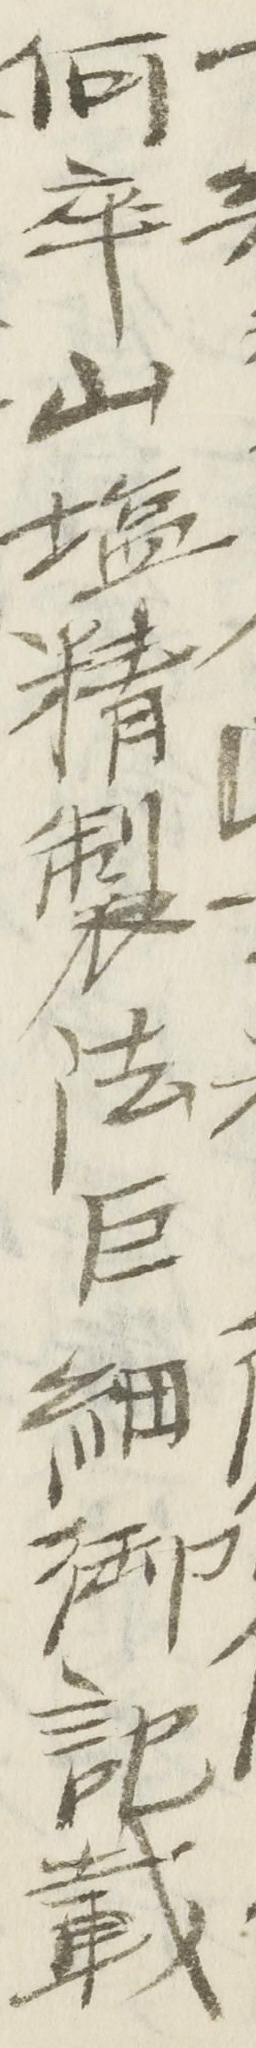何卒山塩精製法巨細御記載
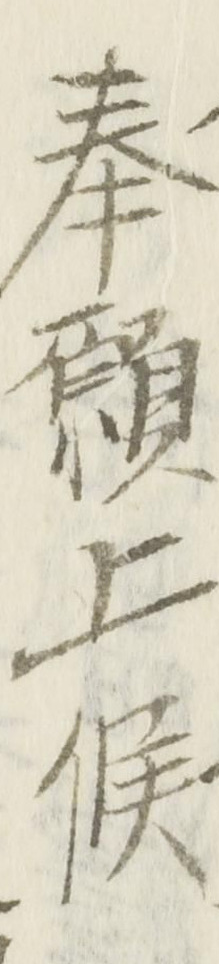奉願上候
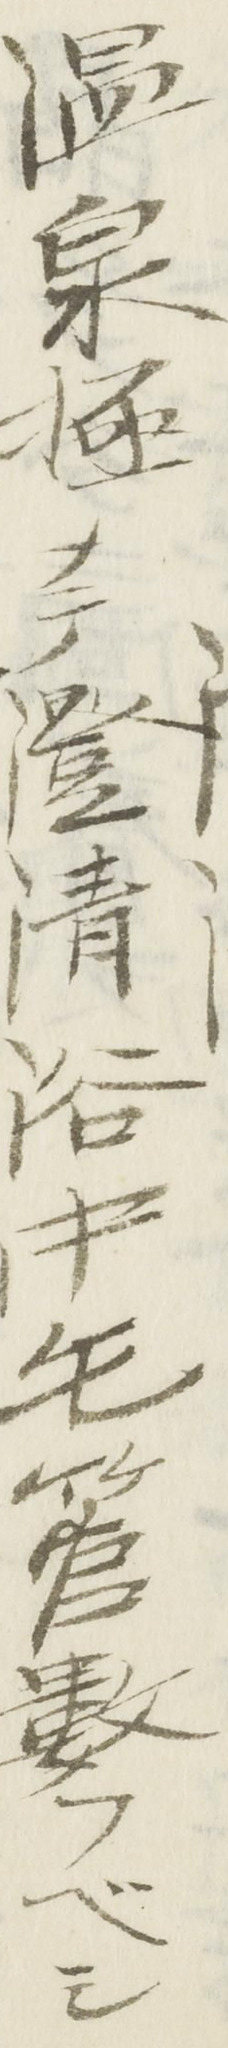温泉極メテ澄清浴中毛管数フベシ
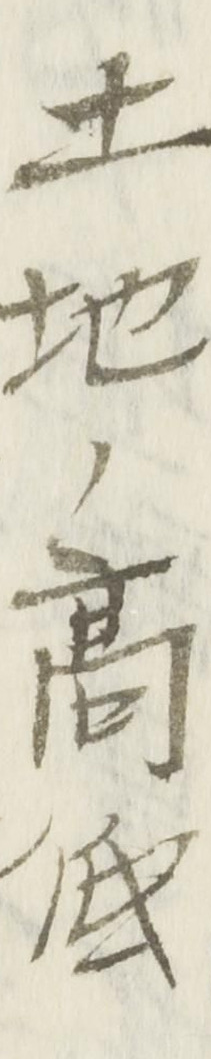土地ノ高低
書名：温冷泉試験表
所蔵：東京大学地震研究所図書室 Earthquake Research Institute Library, The University of Tokyo, JAPAN
